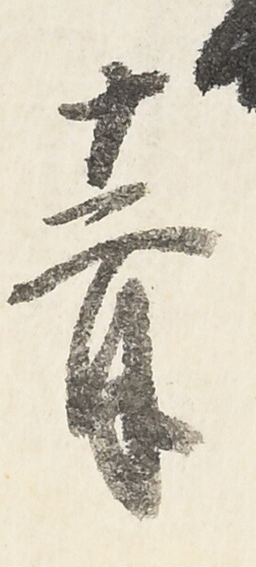十二月
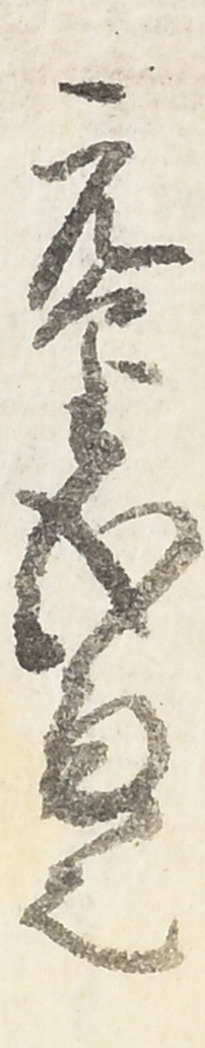元金壱両也
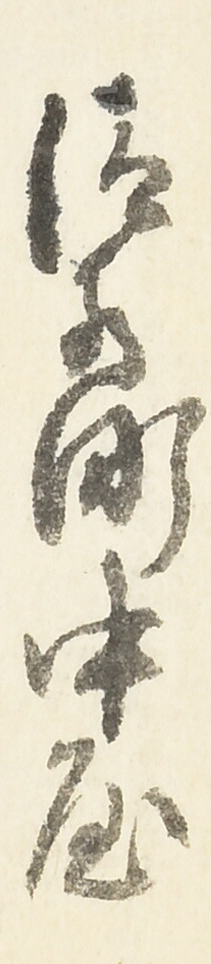清水町丁代
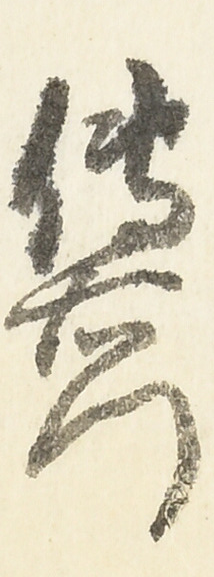伝右衛門
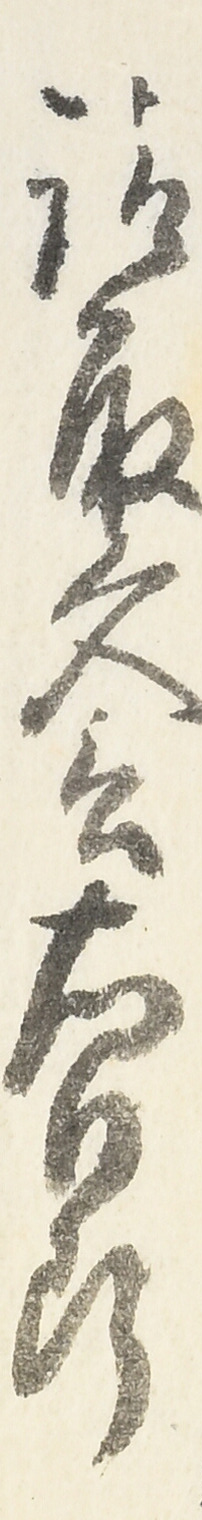請取文言右同断
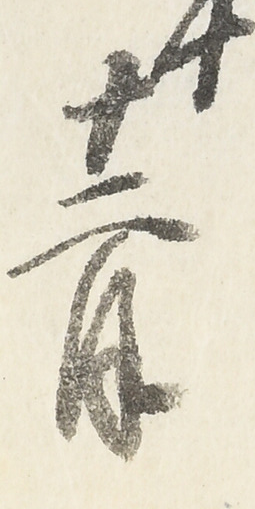十二月
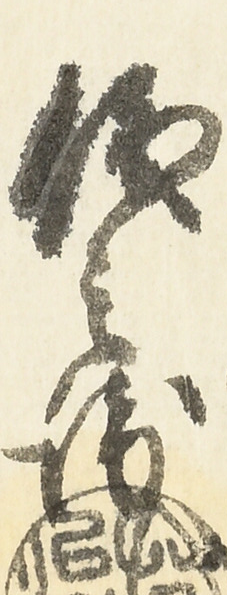午儀兵衛

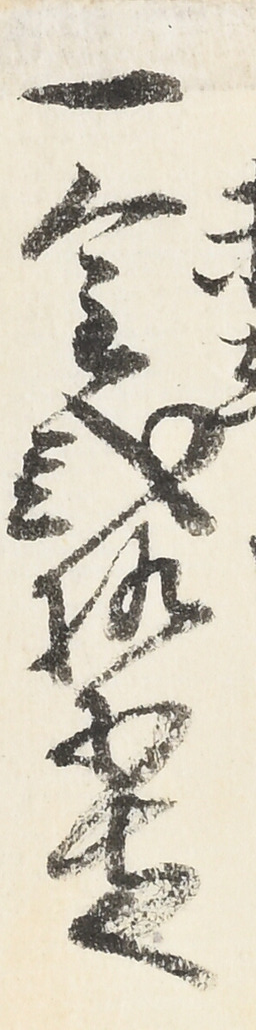一金弐拾五両
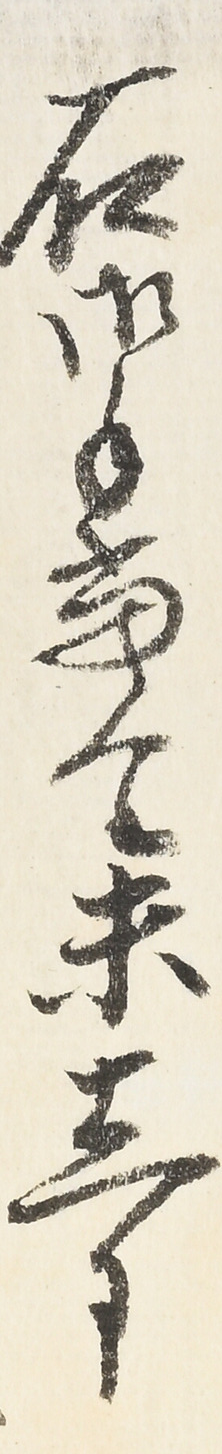右御手当金未十二月
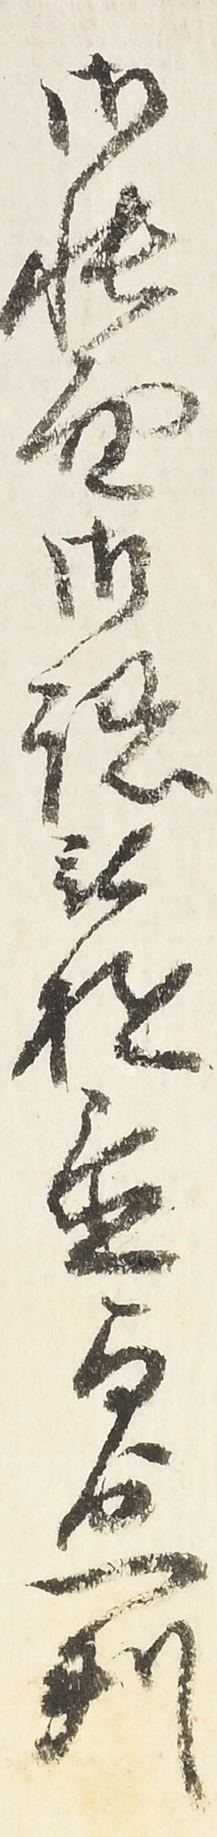御帳面御認被遊置与左衛門一判
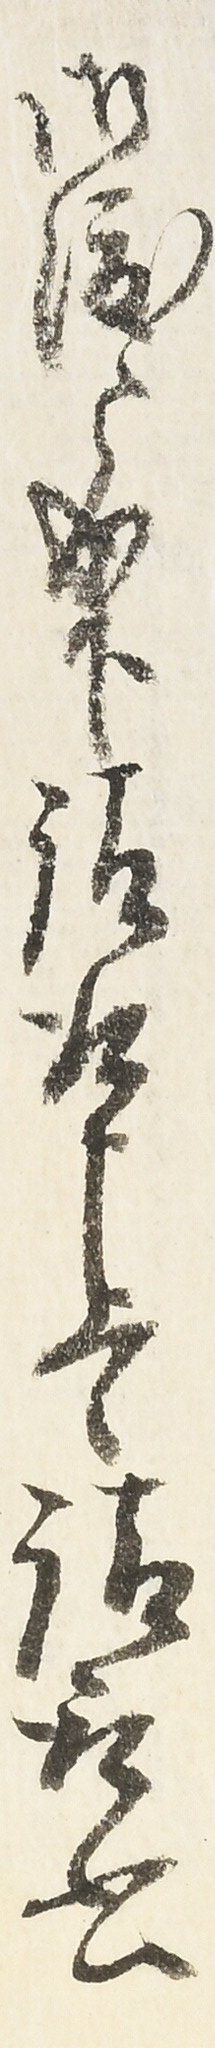御渡被成下請取申上候請取書
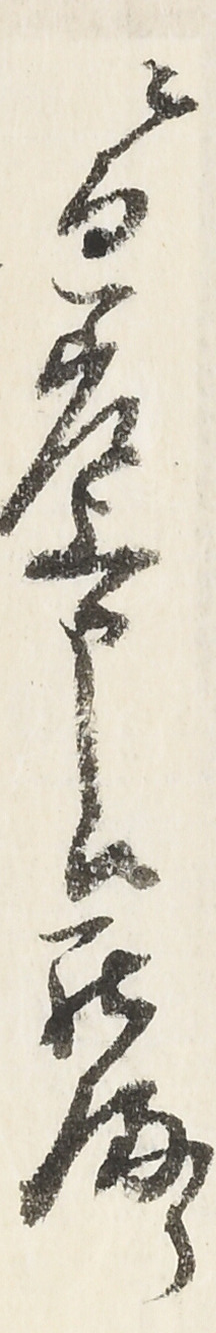ニ而差上申候罷帰り
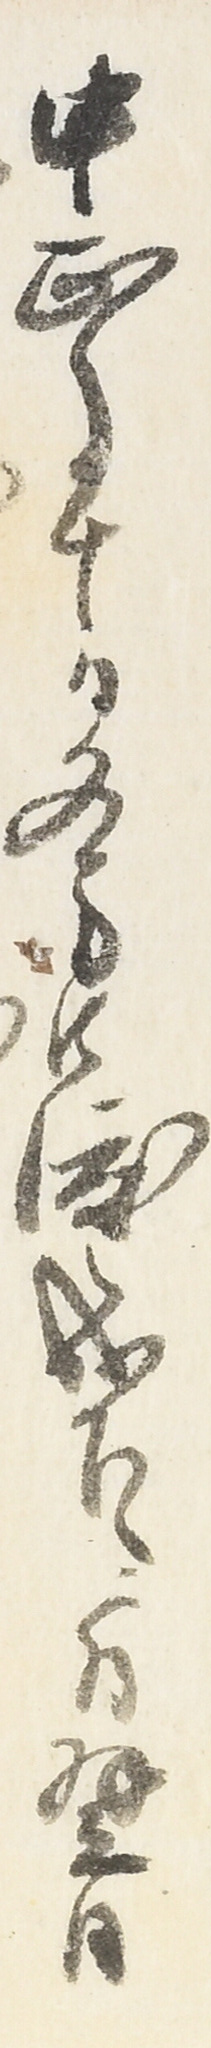申正月十日夕方御渡被成下候ニ付八翌日
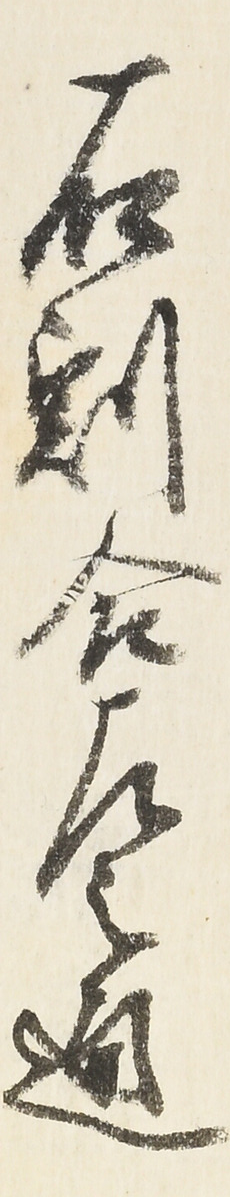右割合左之通
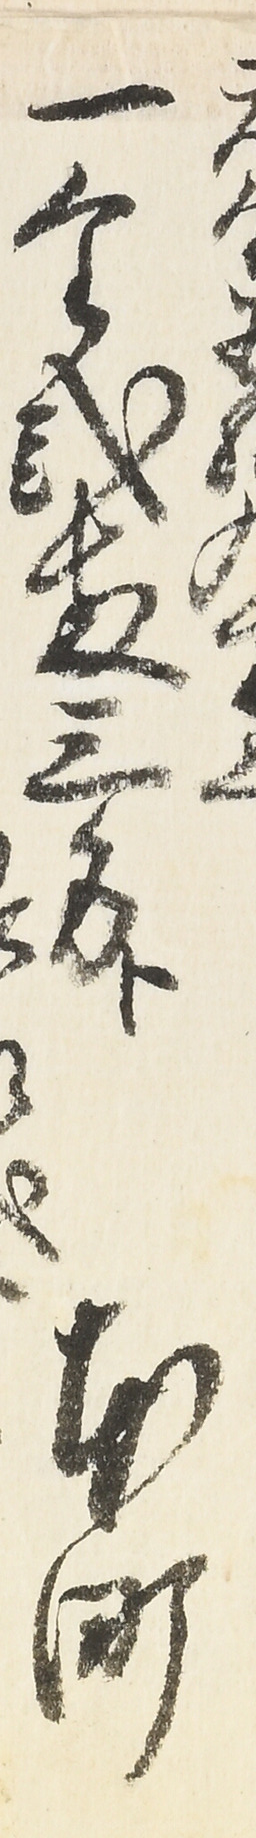一金弐両三分ト本町
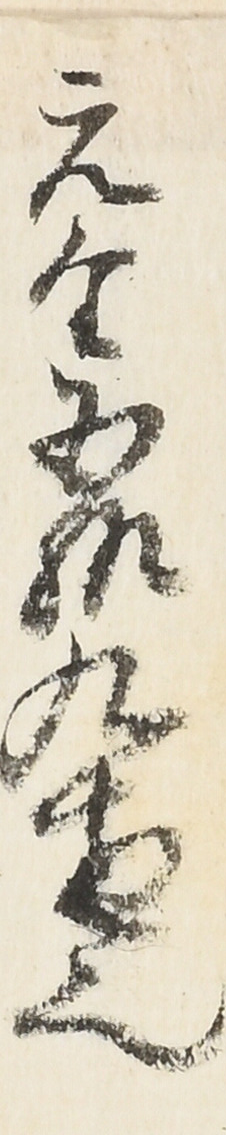元金五拾九両也
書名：御才覚金御利足割渡扣帳
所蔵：伊那市立高遠町図書館・合同会社AMANE
